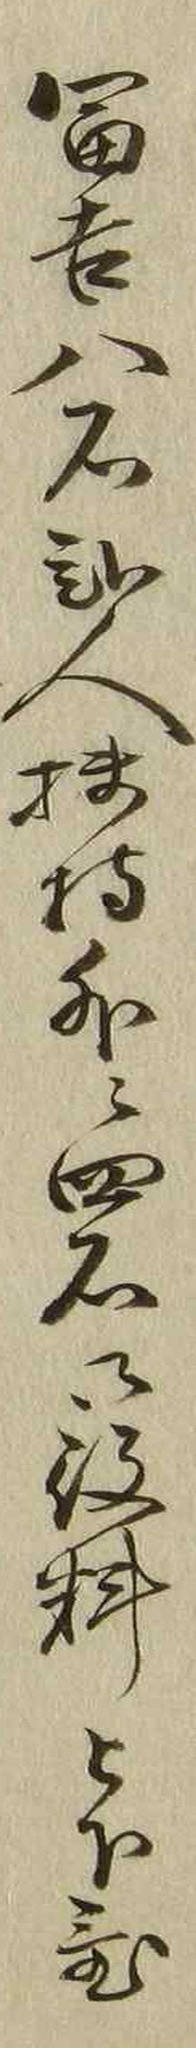冨吉八石弐人扶持外ニ四石御役料被下置
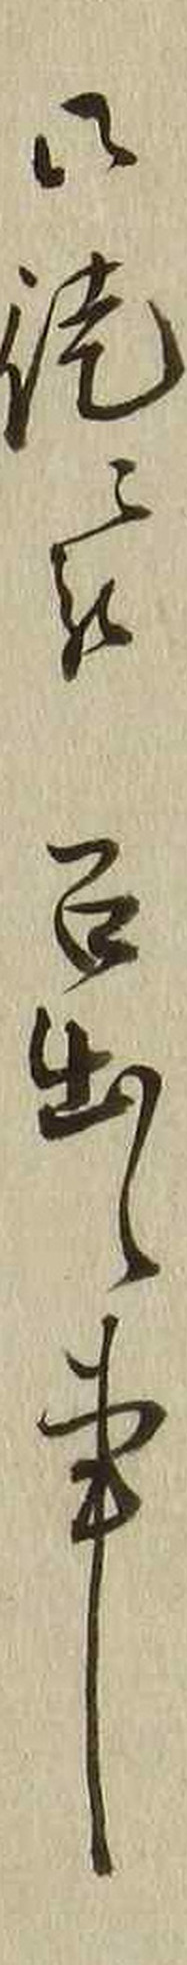御徒ニ被召出候事
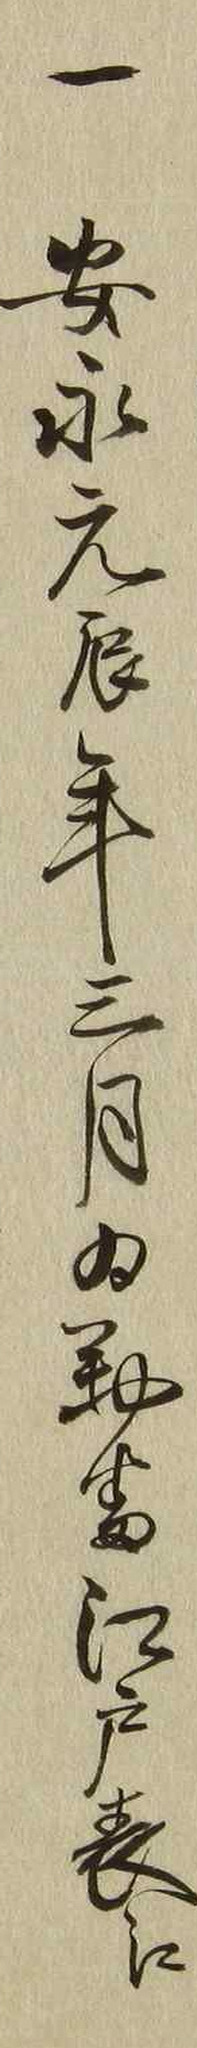一安永元辰年三月為勤番江戸表江
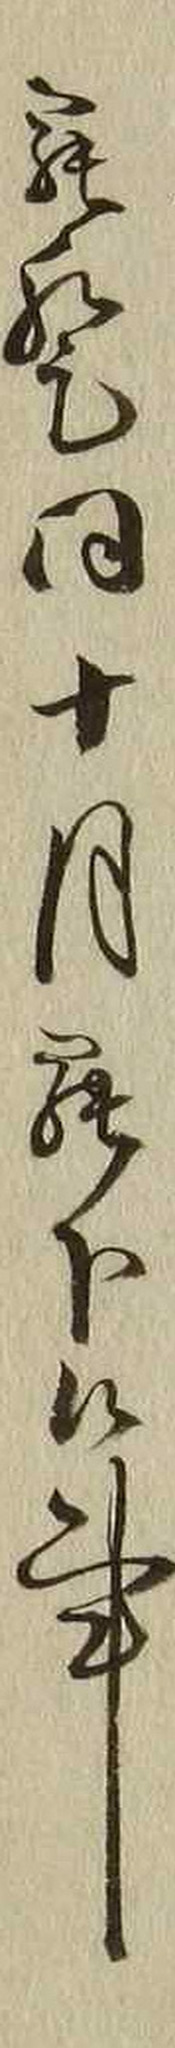罷登堂十月罷下候事
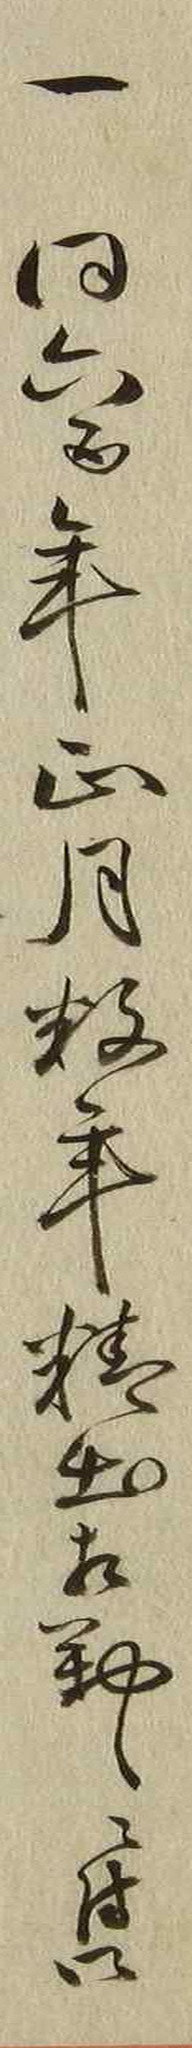一同六酉年正月数年精出相勤候ニ付御
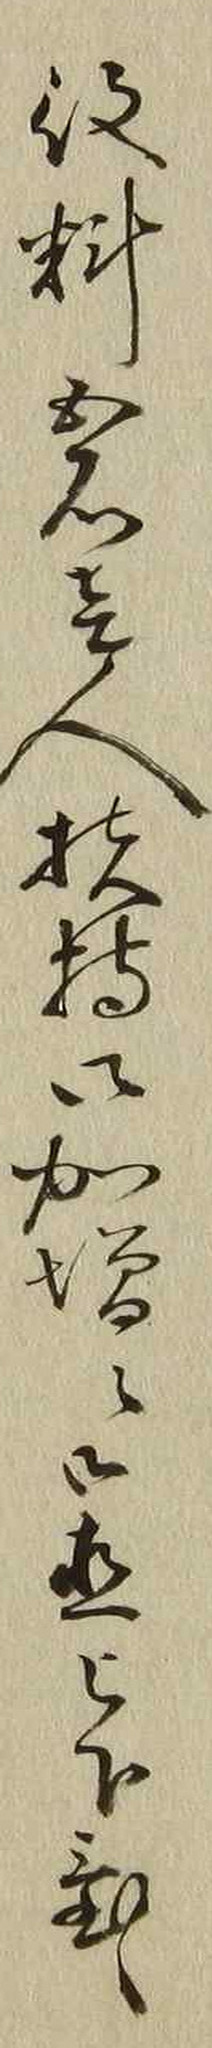役料五石壱人扶持御加増之御直被下置候
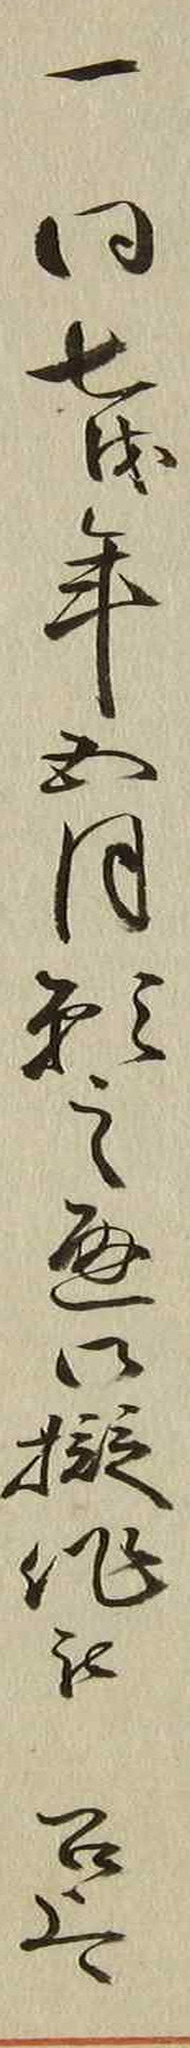一同七戌年五月願之通御擬作被召上候
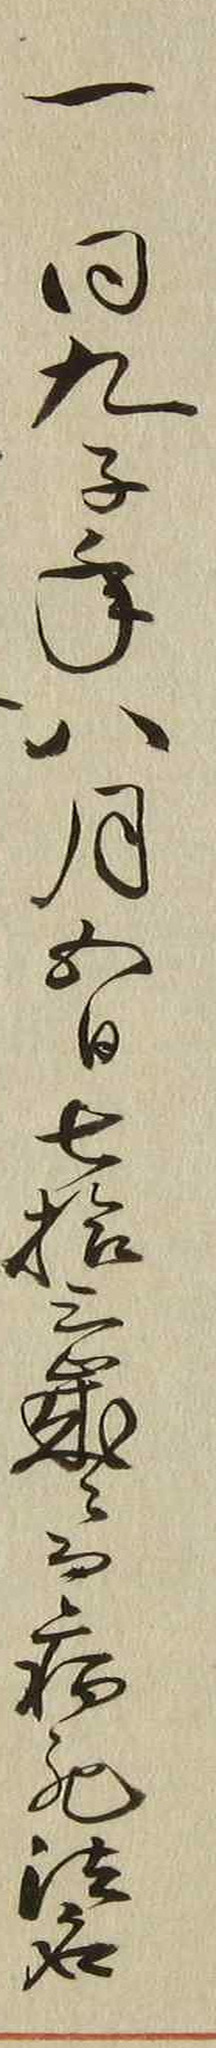一同九子年八月五日七拾三歳ニ而病死法名
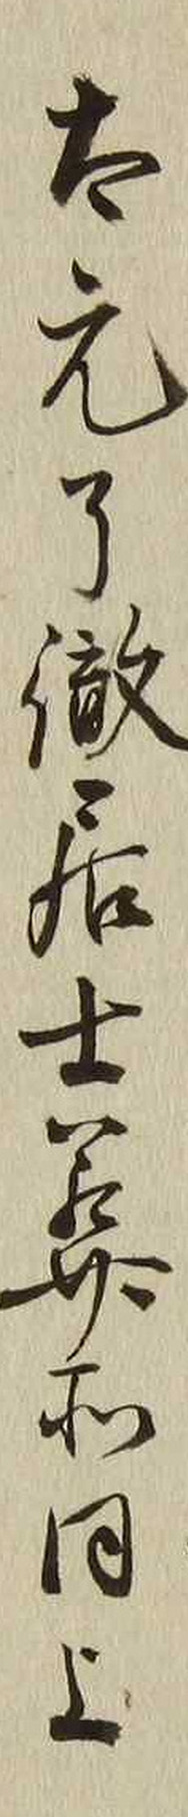太元了徹居士葬所同上
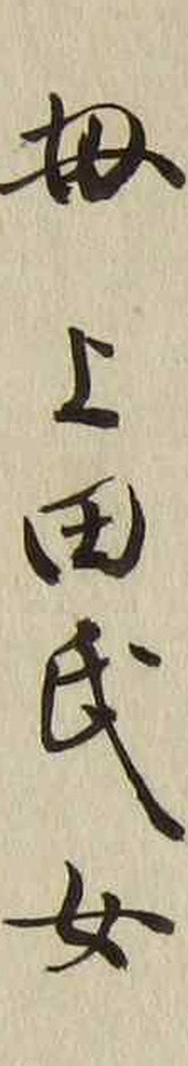母上田氏女

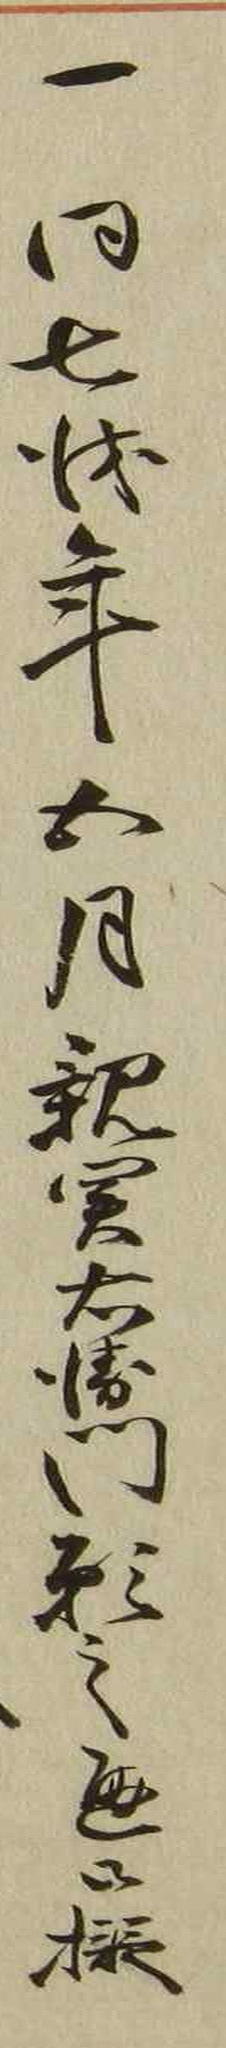一同七戌年五月親関右衛門願之通擬
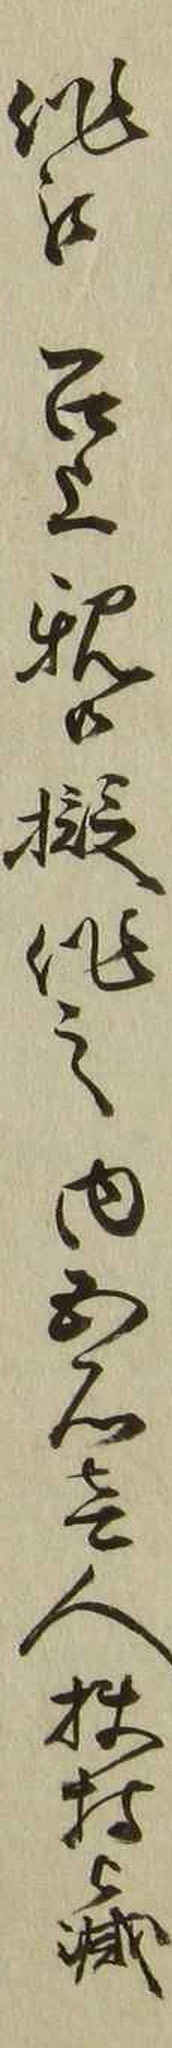作江被召上親御擬作之内五石壱人扶持被減
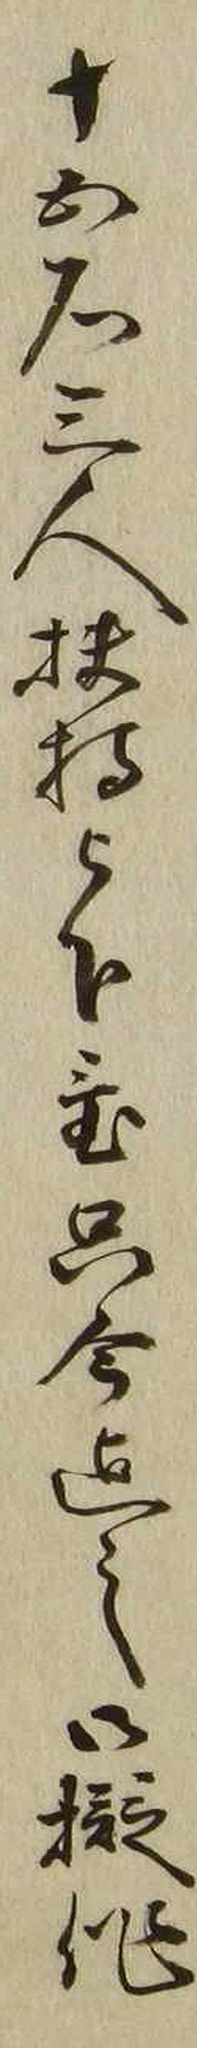十五石三人扶持被下置只今迄之御擬作
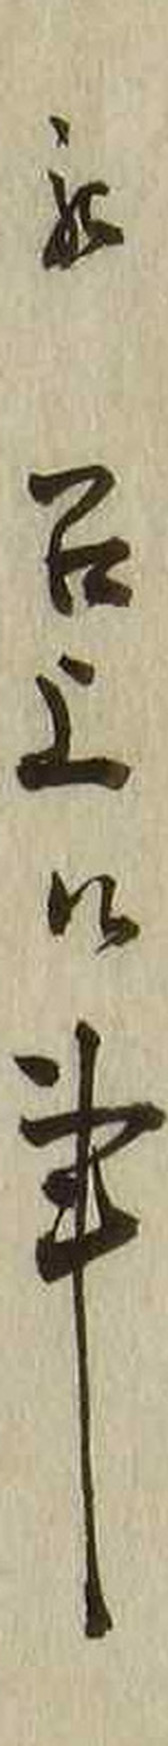被召上候事
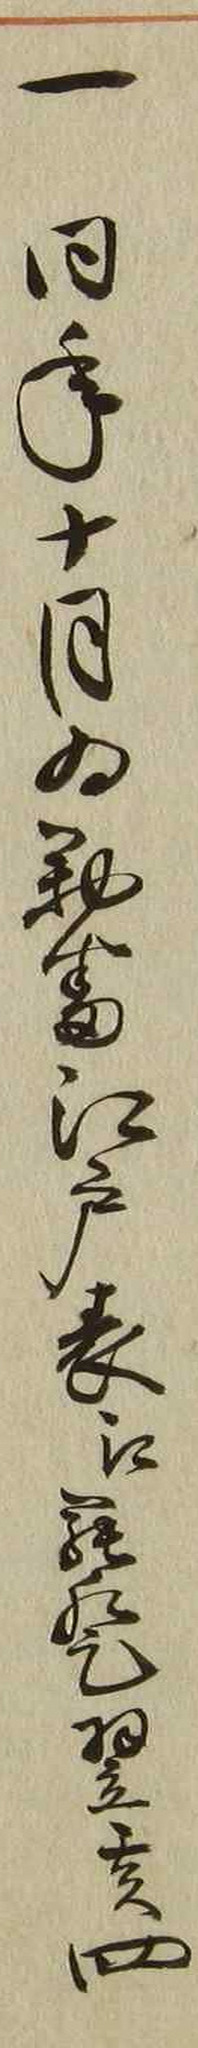一同年十月為勤番江戸表江罷登翌亥四
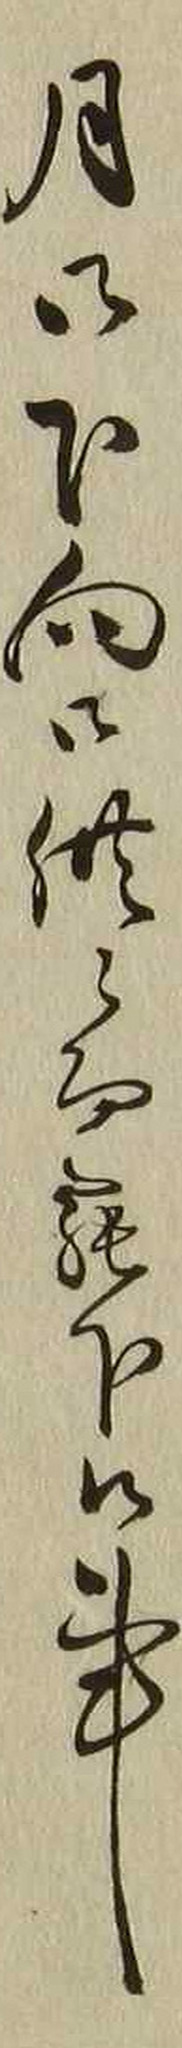月御下向御供ニ而罷下候事
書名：諸士系譜　巻之65　ち之部1
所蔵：会津若松市立会津図書館
